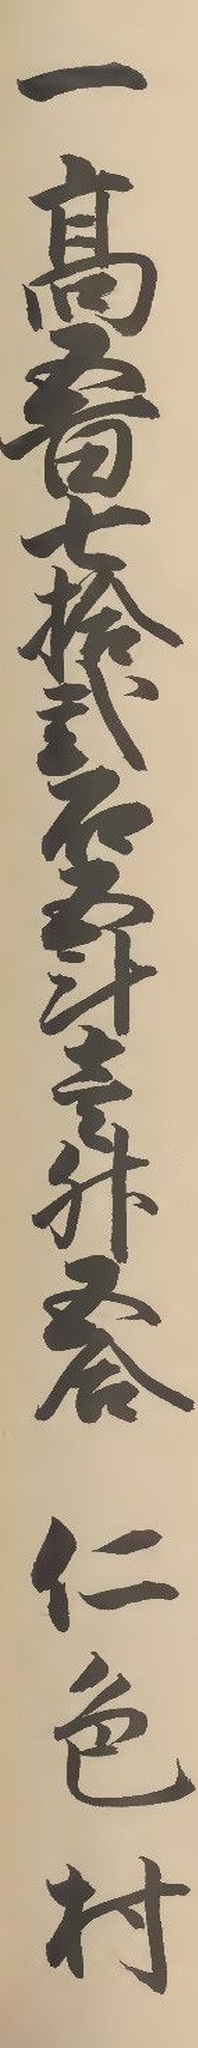一髙五百七拾弐石五斗壱升五合仁色村
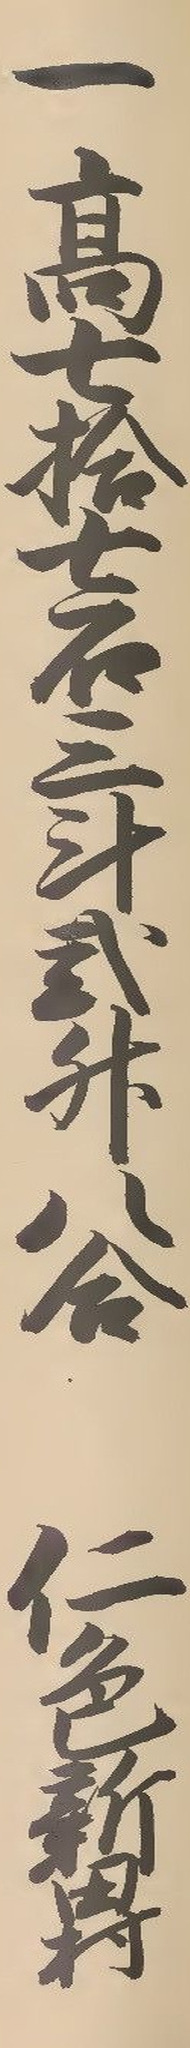一髙七拾七石三斗弐升八合仁色新田村
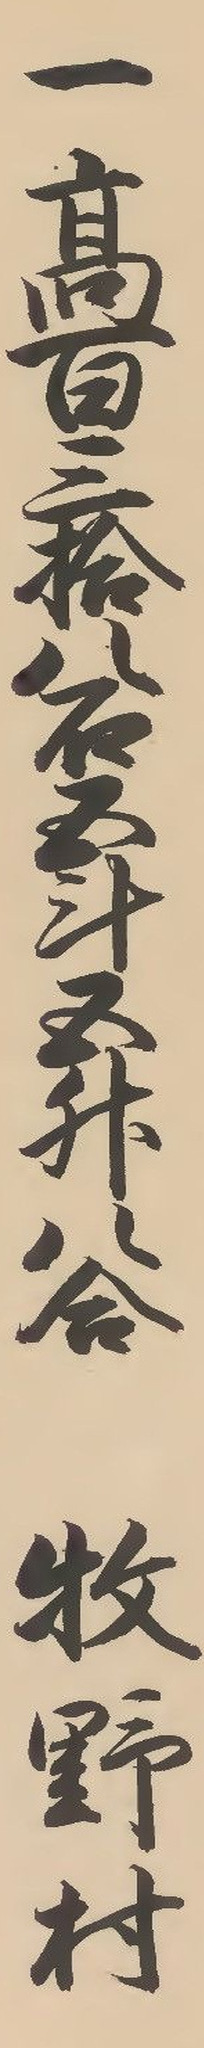一髙百三拾八石五斗五升八合牧野村
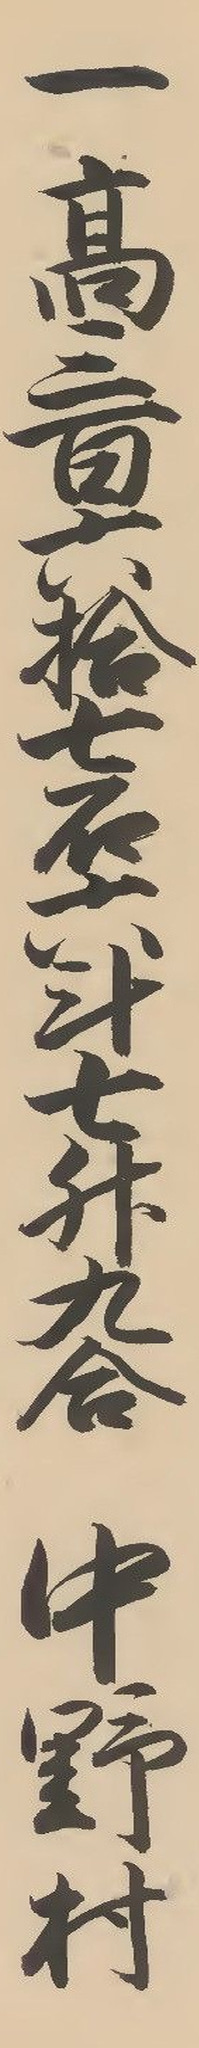一髙三百六拾七石六斗七升九合中野村
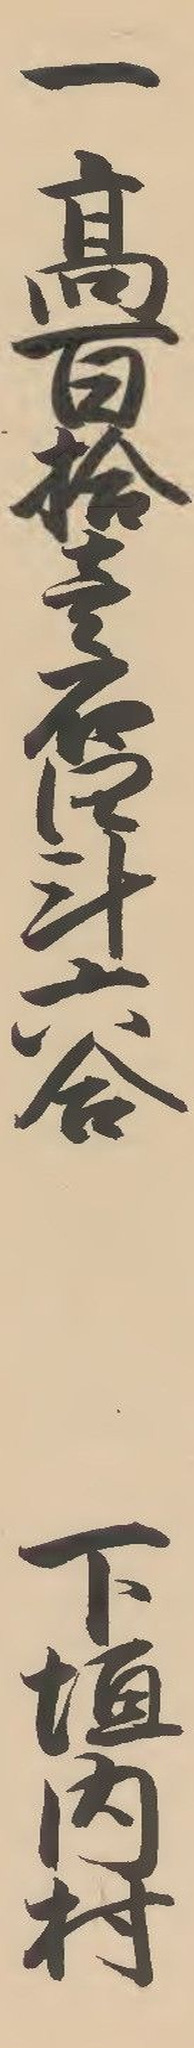一髙百拾壱石四斗六合下垣内村

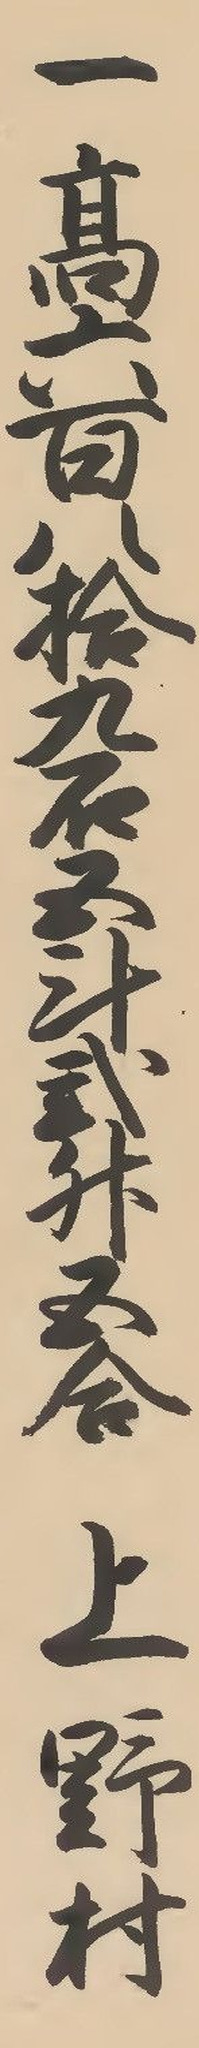一髙六百八拾九石五斗弐升五合上野村
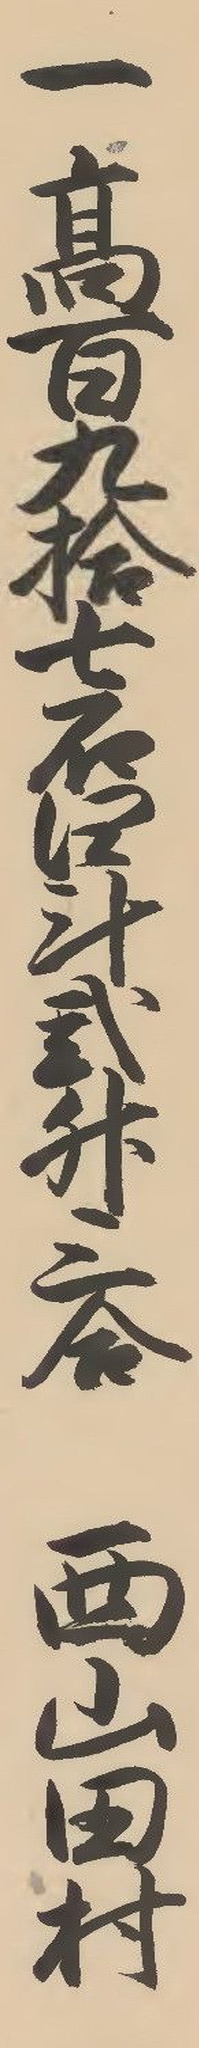一髙百九拾七石四斗弐升三合西山田村
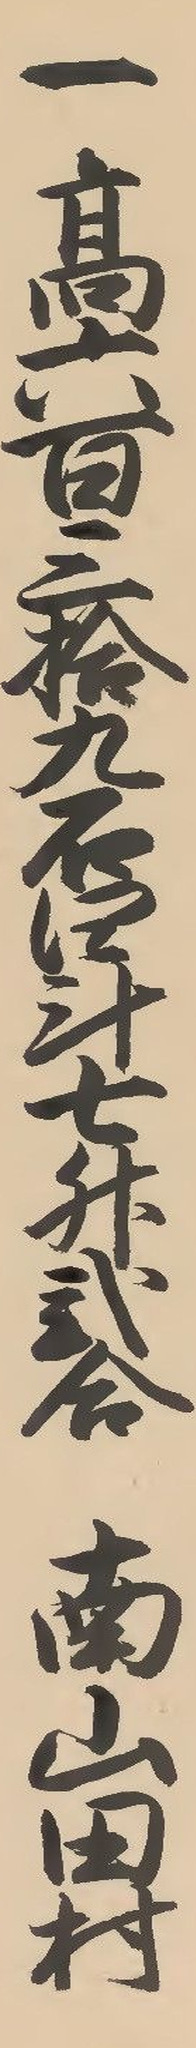一髙六百三拾九石四斗七升弐合南山田村
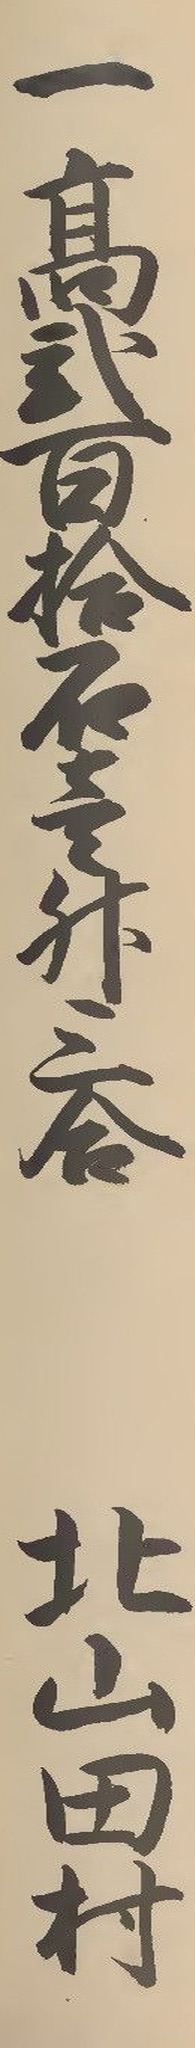一髙弐百拾石壱升三合北山田村
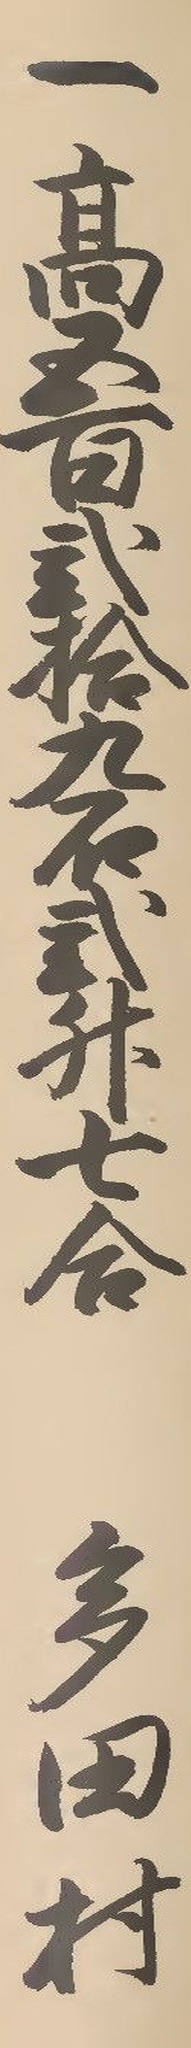一髙五百弐拾九石弐升七合多田村
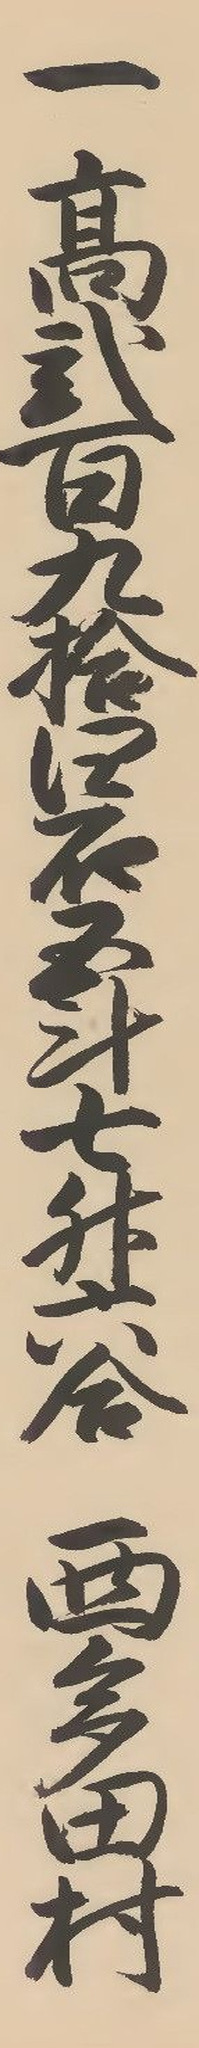一髙弐百九拾四石五斗七升六合西多田村
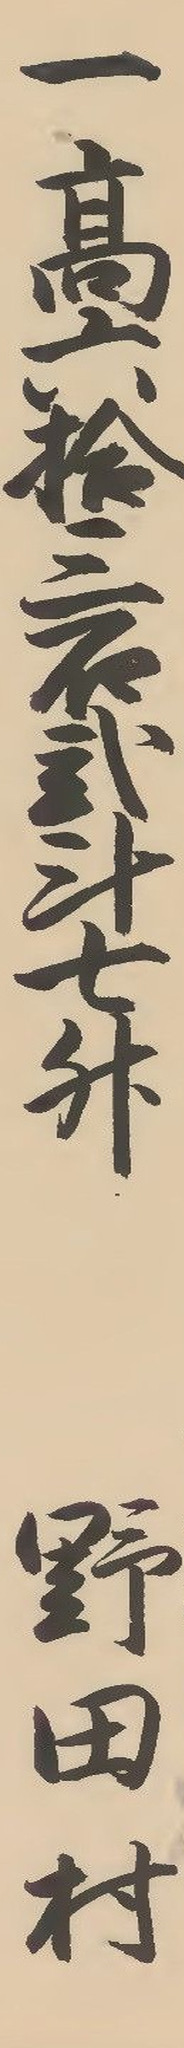一髙六拾三石弐斗七升野田村
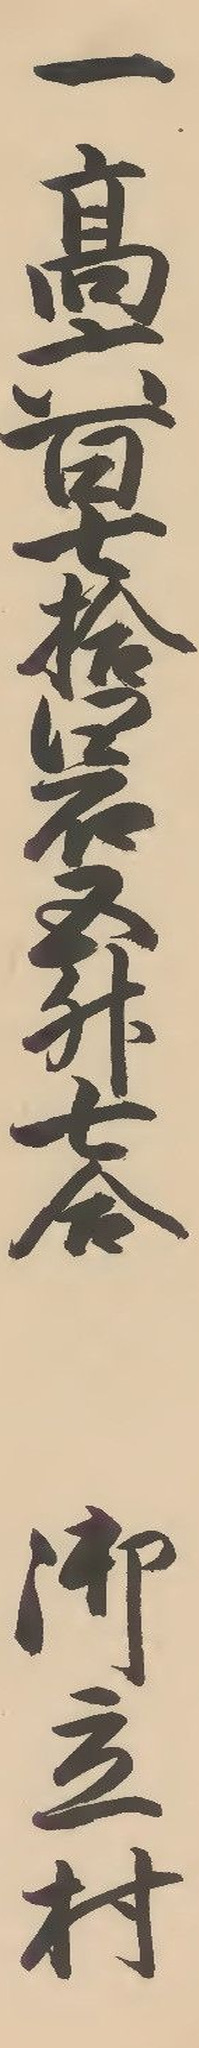一髙六百七拾四石五升七合御立村

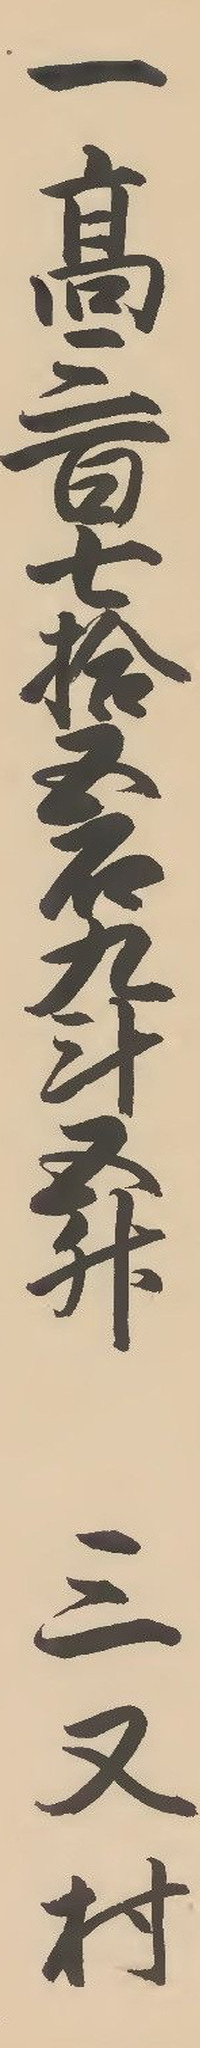一髙三百七拾五石九斗五升三又村
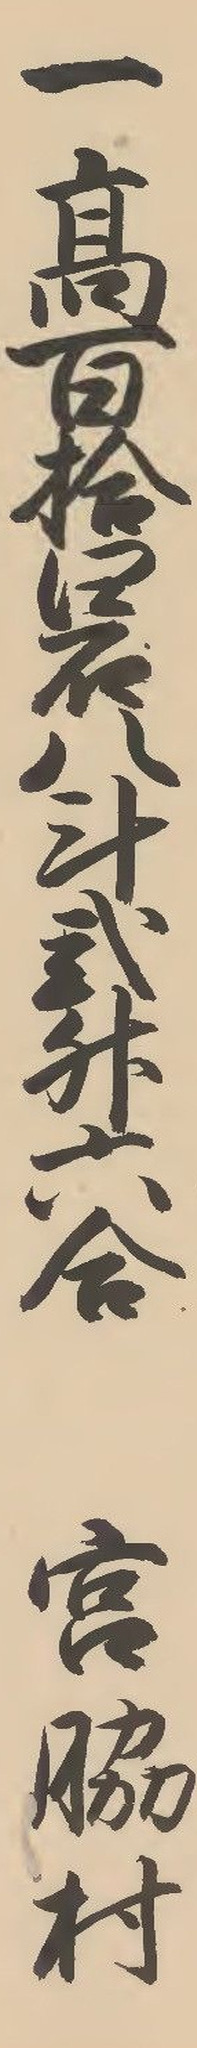一髙百拾四石八斗弐升六合宮脇村
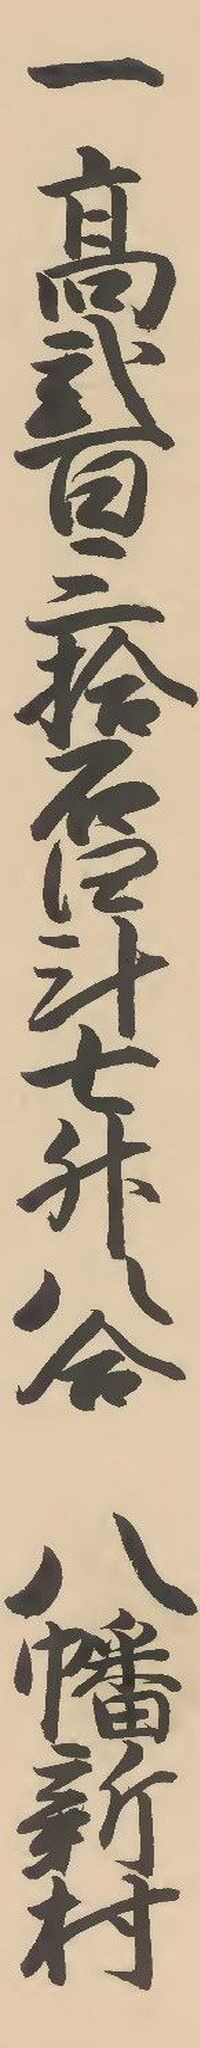一髙弐百三拾石四斗七升八合八幡新村
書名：播磨国郷帳
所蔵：国立公文書館 National Archives of Japan
